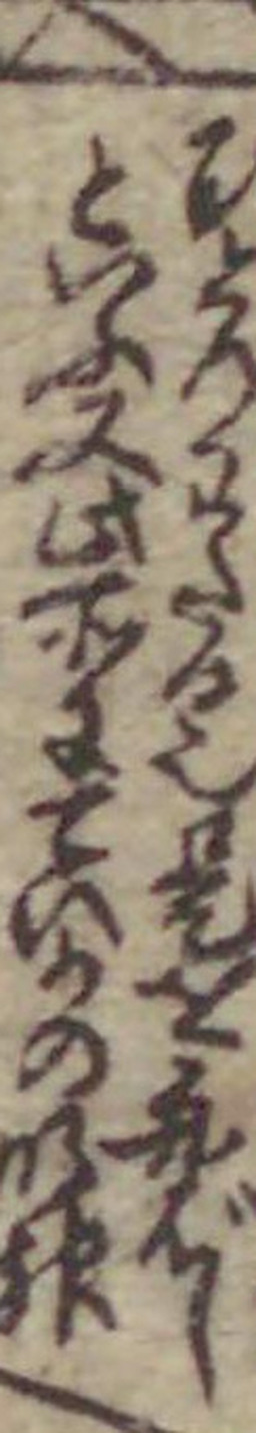といふ又此所にていかの明夜
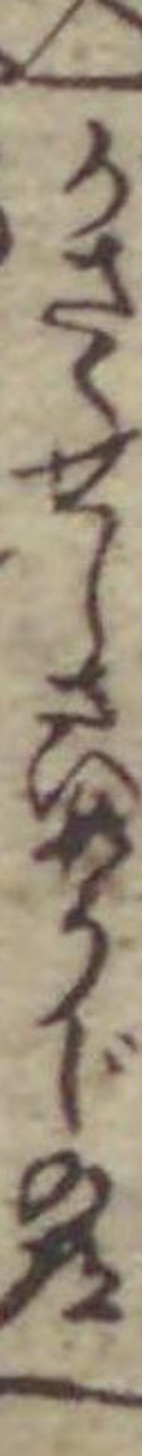がさくせしさいめうじの道
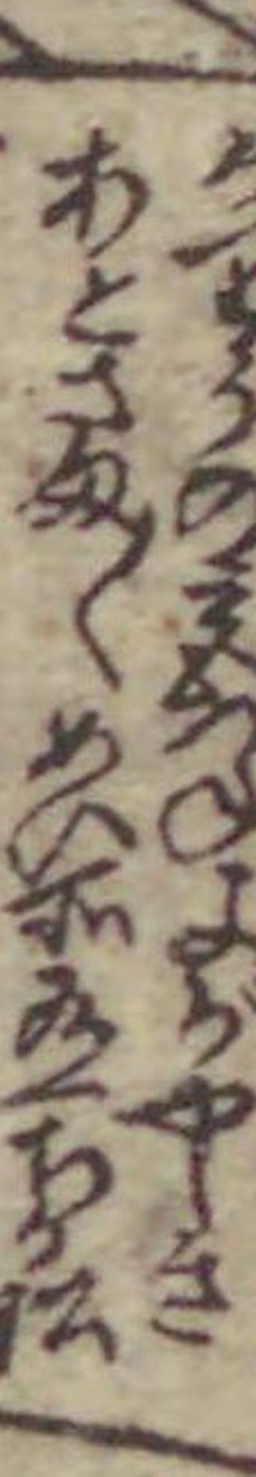あとさま〳〵めい所有ちか松
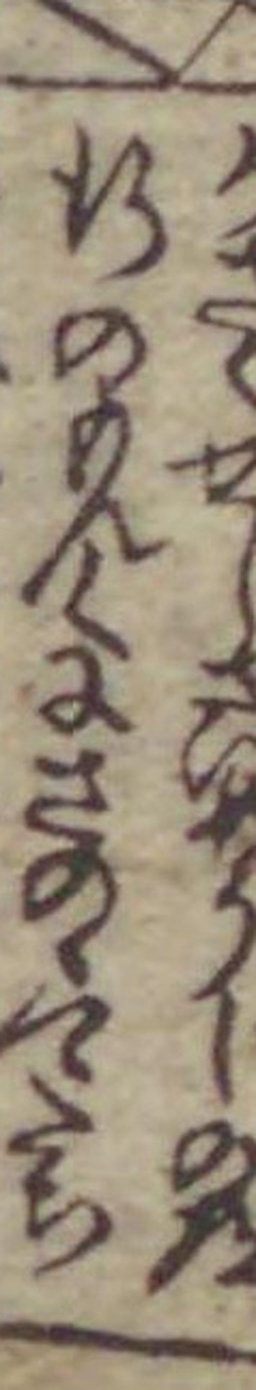行のもんくにさのゝてたち
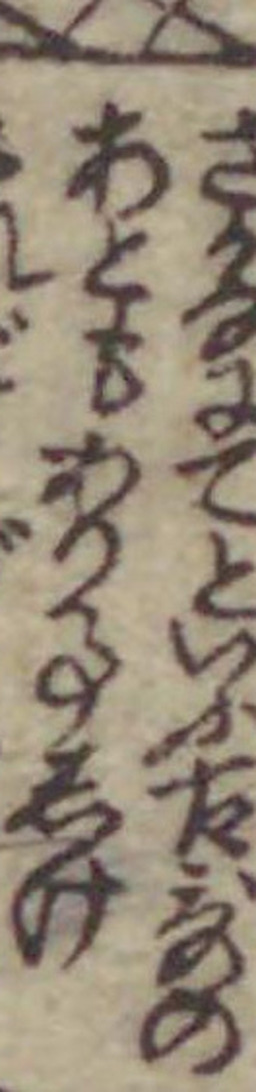あともあり事しけ
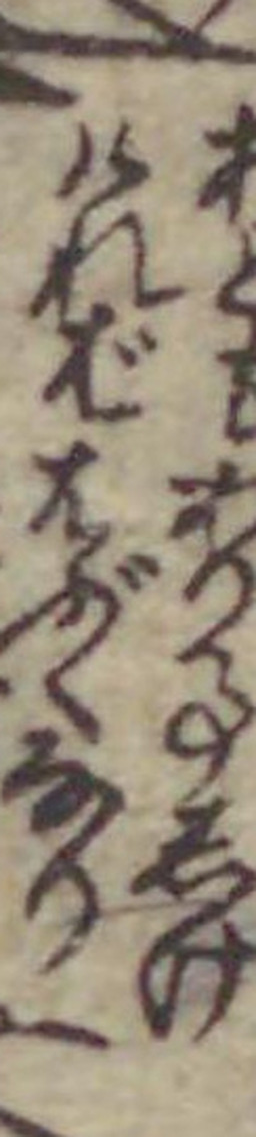ければはぶくなり
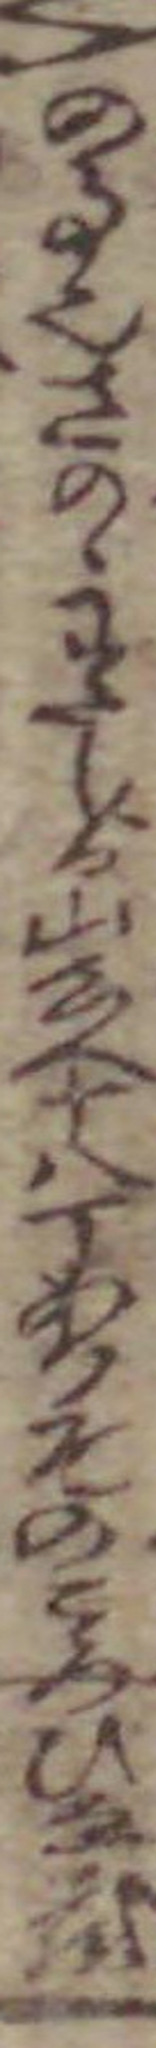の事也さのゝわたしより山さへ十八丁ありそのころひな藏
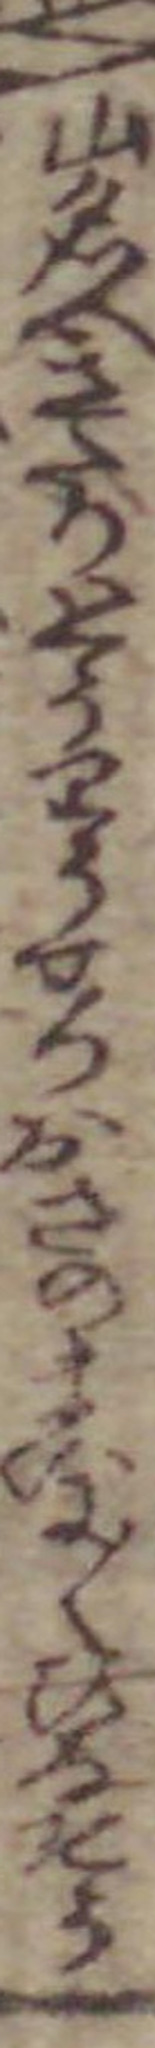山名へきたりとうりうせりおさのまいに〳〵ひなそう
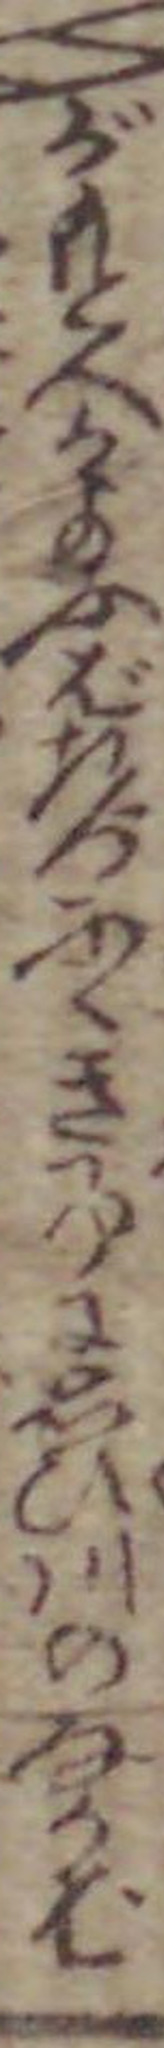がもとへかよふば左衛門にくきに思ひ川のなかば
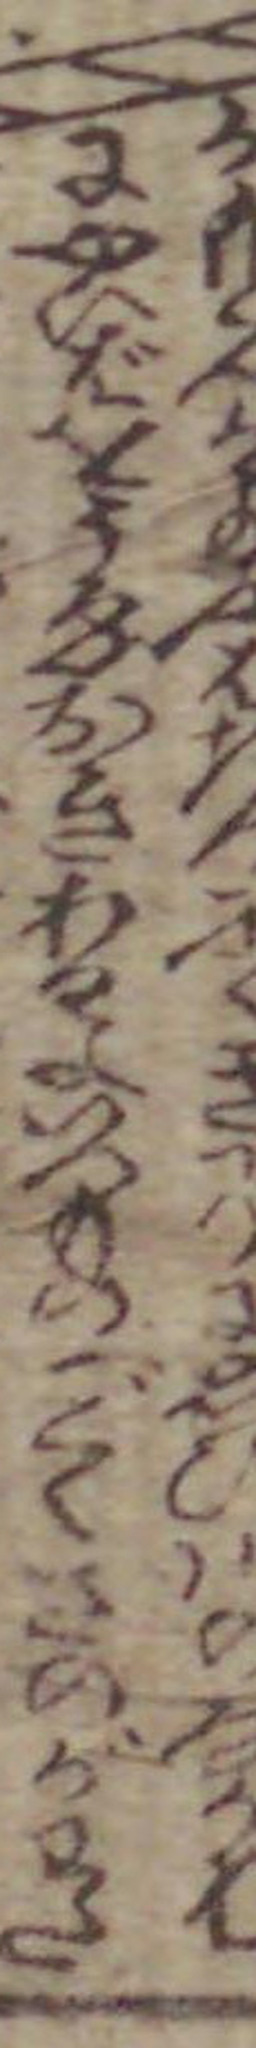にやいばをうゑおきあるよいつものごとくさのがわた
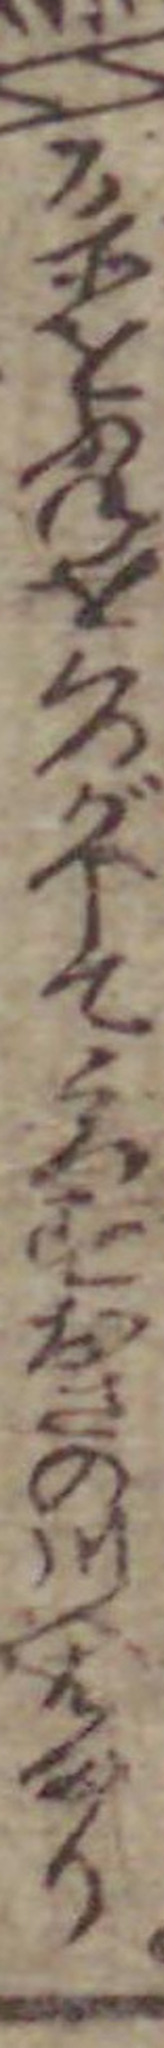る所をふねをくつがへしてくつすおさの川へはなり
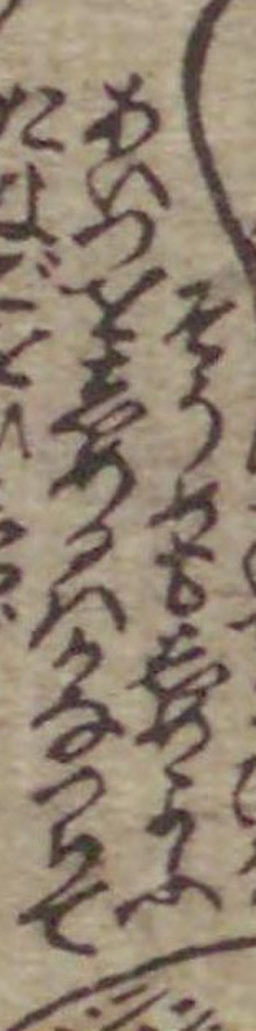あいつをしめるはかなつりて
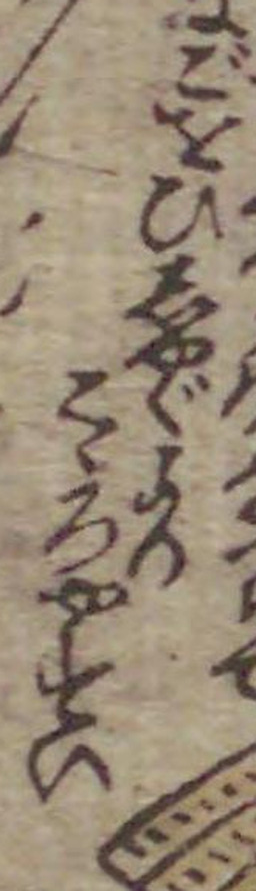こゝろやすい
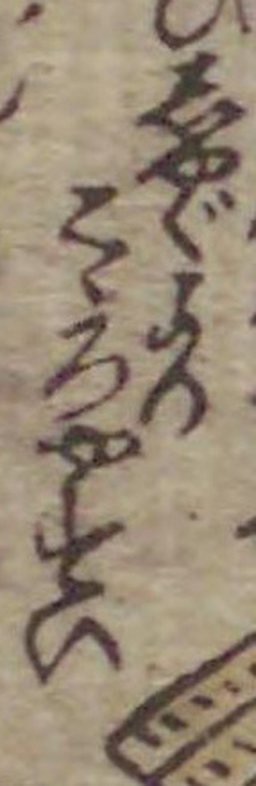こゝろやすい

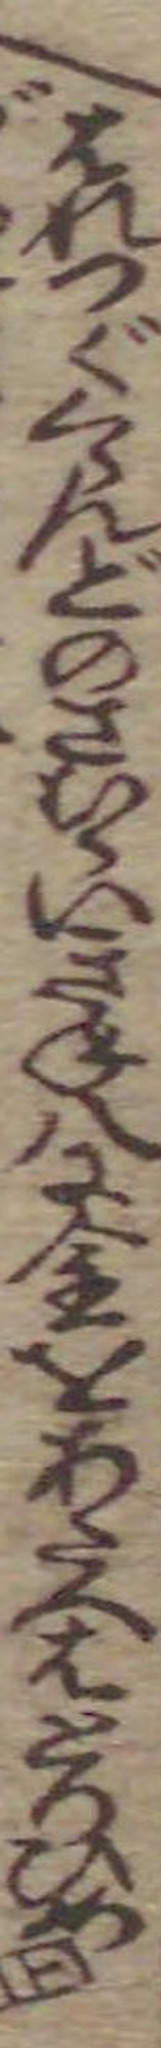はれつぐくらんどのさむらいきね八に金をあたへはとりひめ
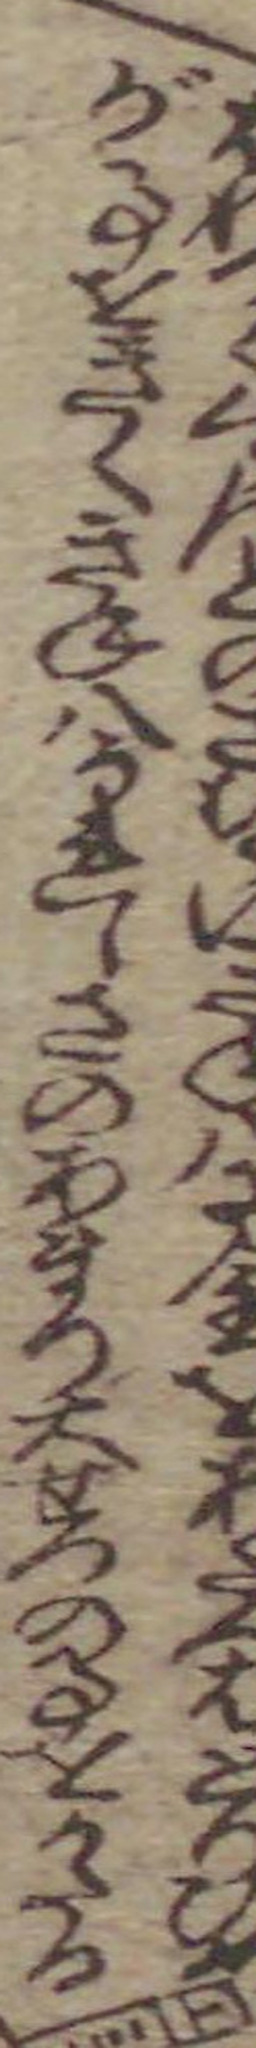が事をきくきね八うれしさのあまり大せつの事をかたる
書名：娜二代鉢木 5巻
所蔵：国立国会図書館 National Diet Library, JAPAN
